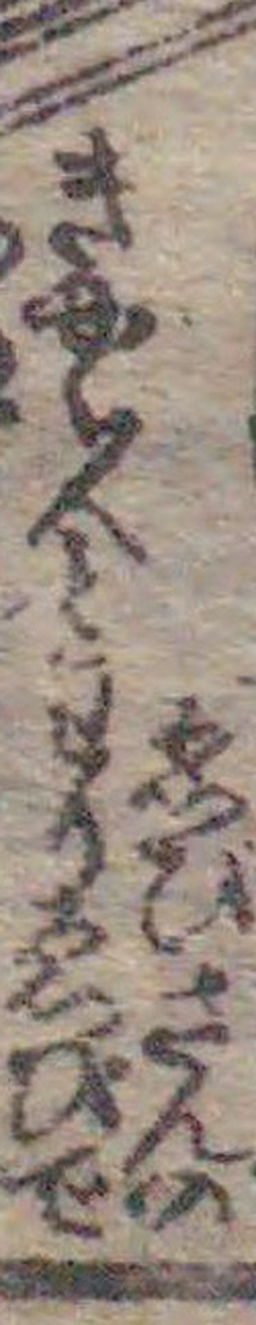きやく人とわりゑびで
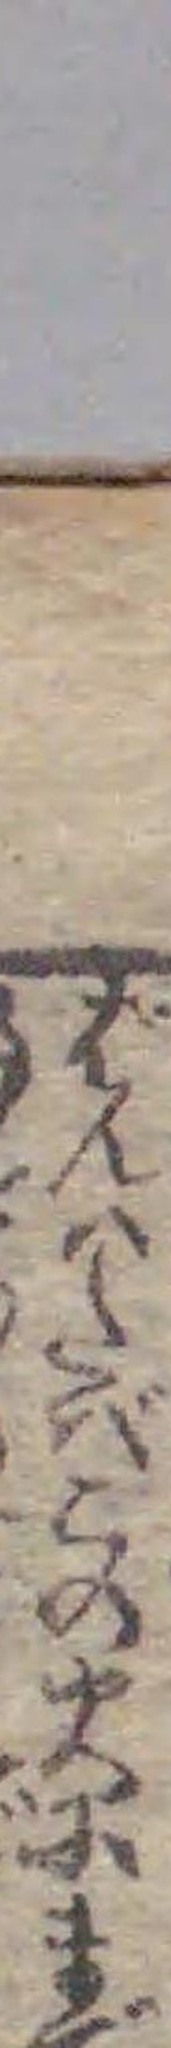ばんはたばこの火にまで
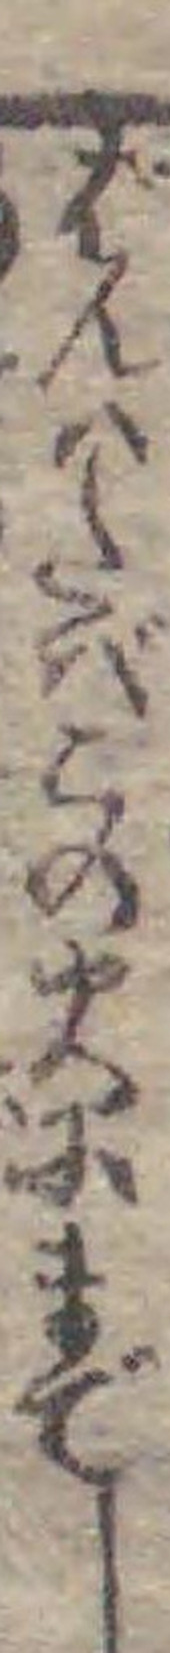ばんはたばこの火にまで
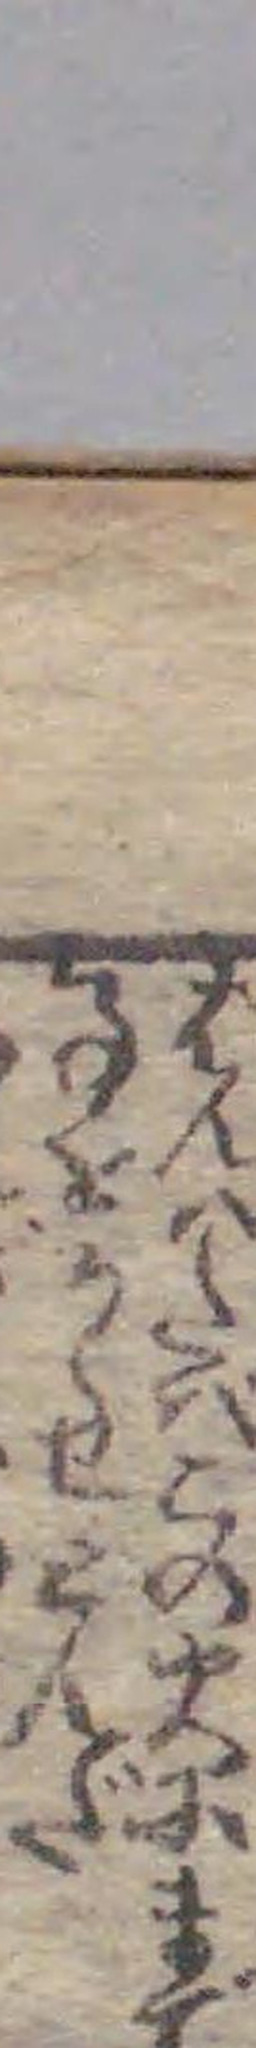事をかゝせとんだ
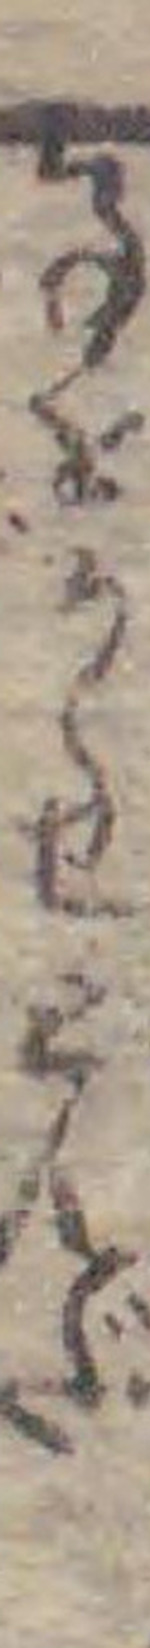事をかゝせとんだ
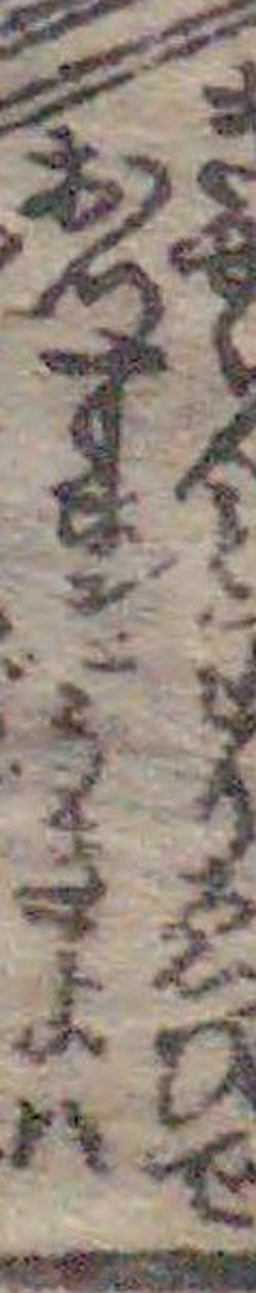おつすホンニうきよは
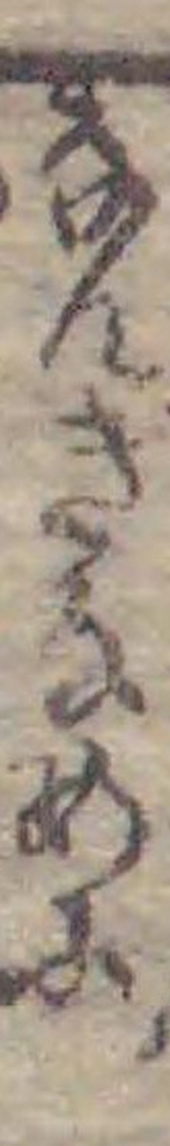なんぎなめに
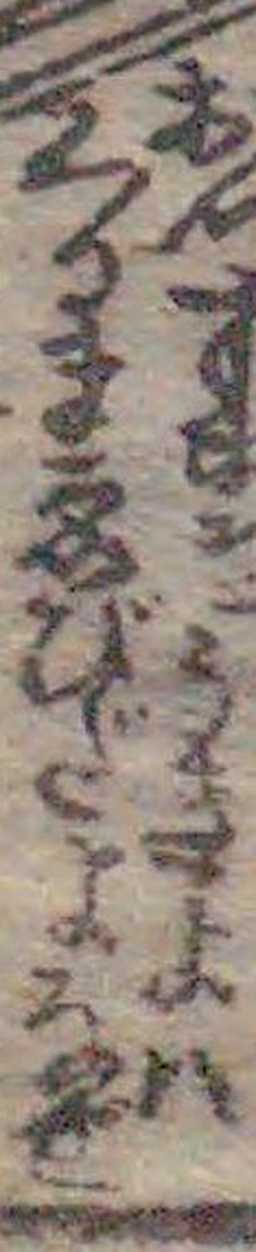くるまゑびだよなせ
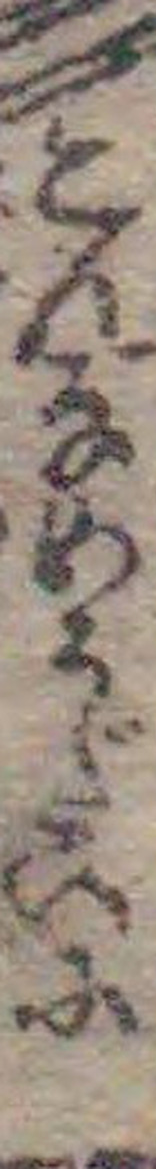こんなめうだいに
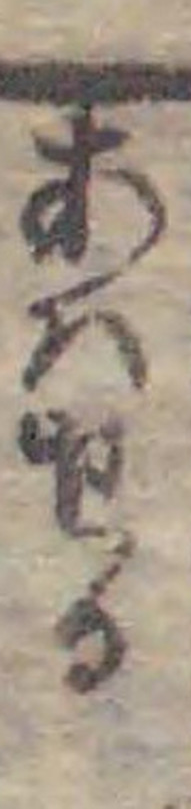あはせる
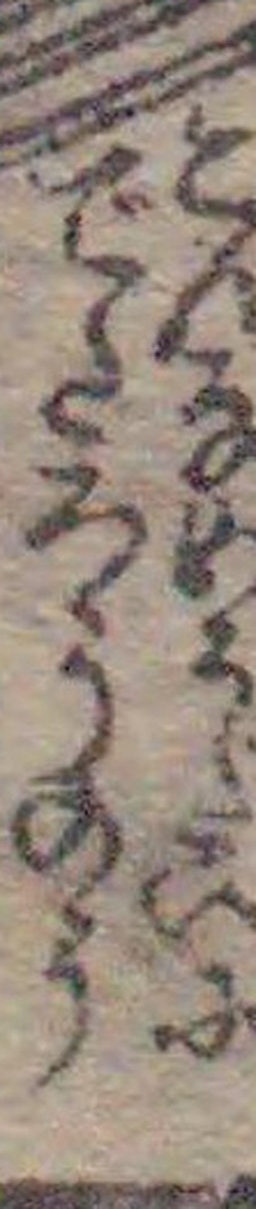でたろうのう

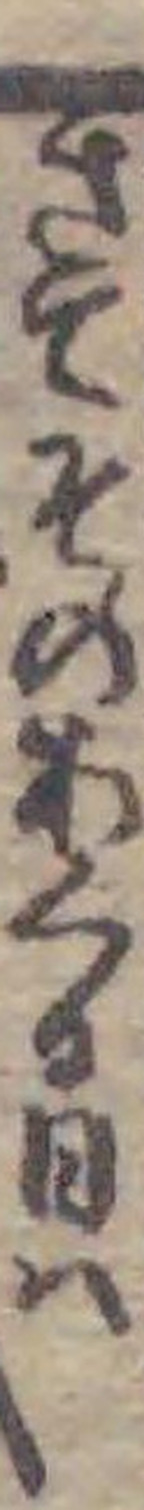さてそのあくる日は
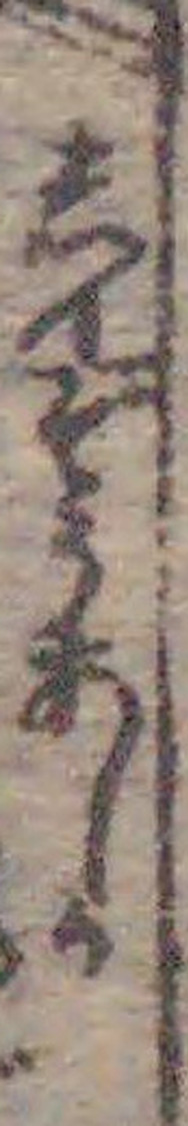しんぞうあしか
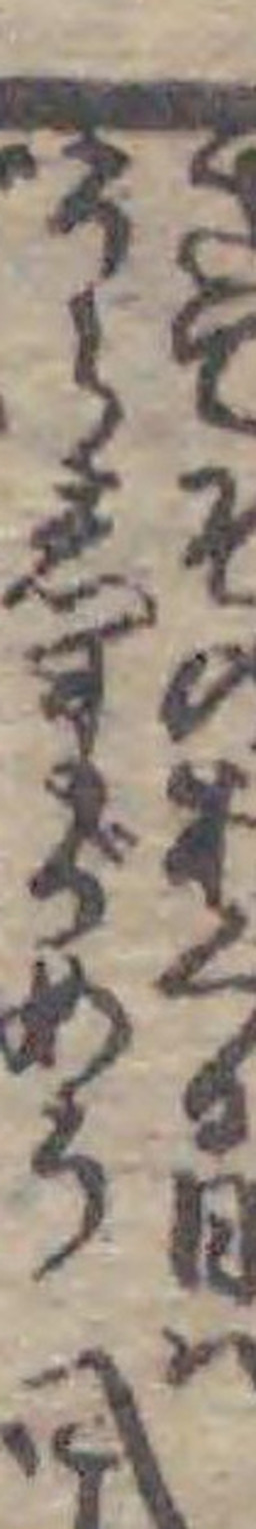うらしまがめう
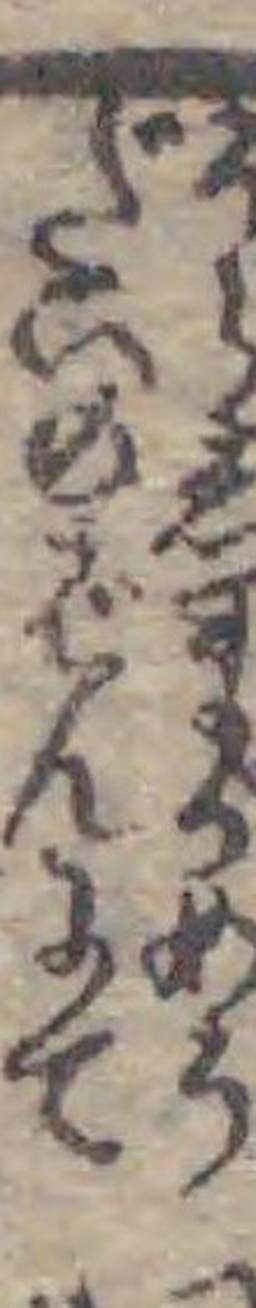だいのばんにて
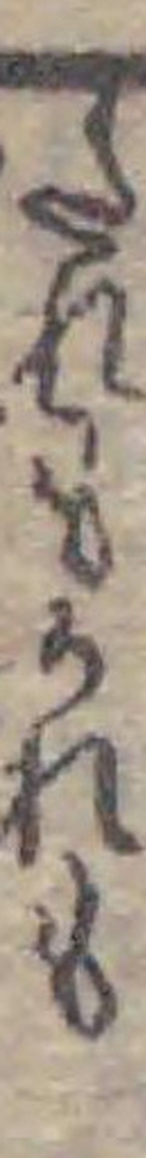たれもかれも
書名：竜宮苦界玉手箱 : 3巻
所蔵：国立国会図書館 National Diet Library, JAPAN
